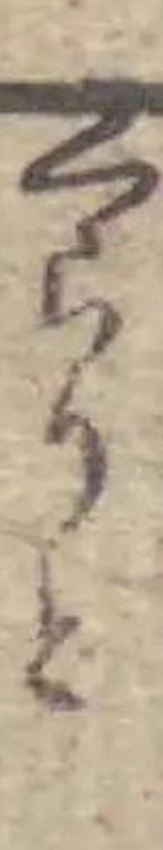くらりと
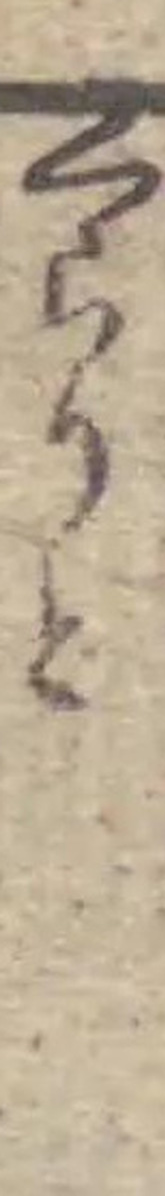くらりと
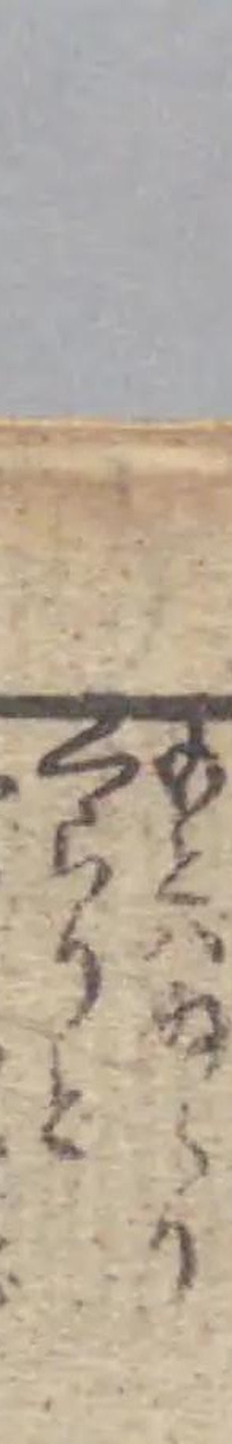くらりと
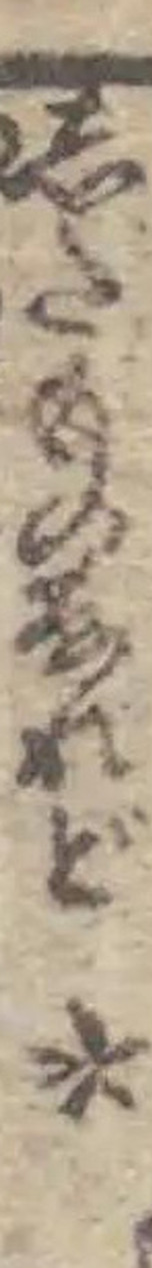したものなれど
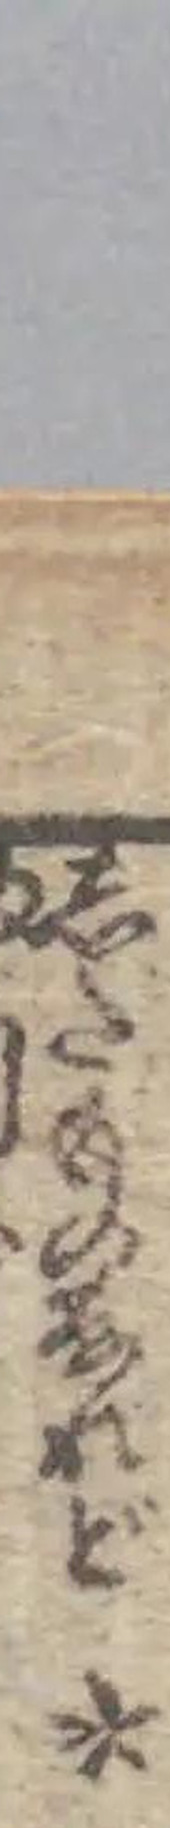したものなれど
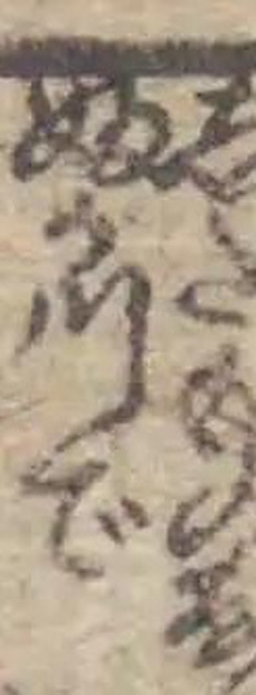ふか川で
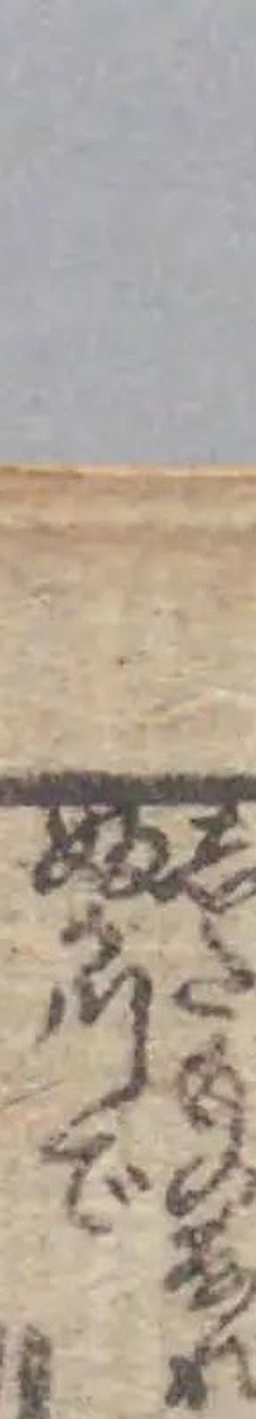ふか川で
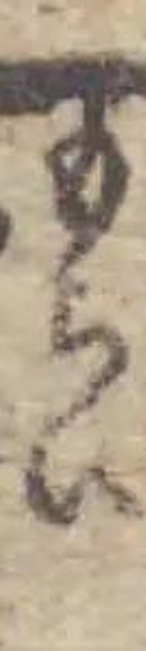もちい
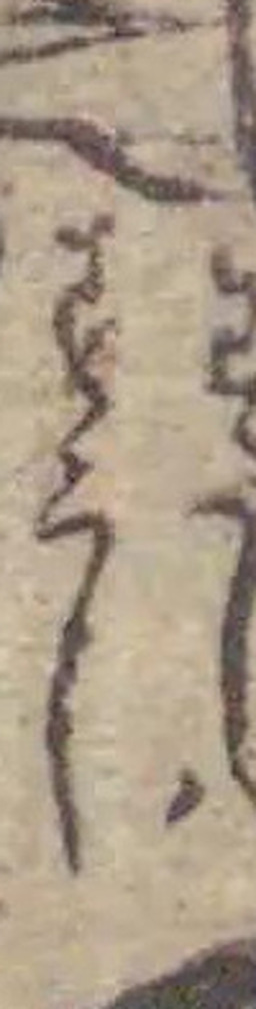すこし
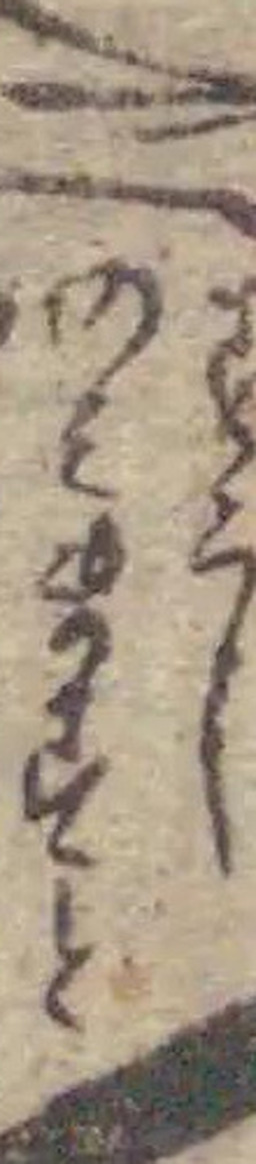のみますと
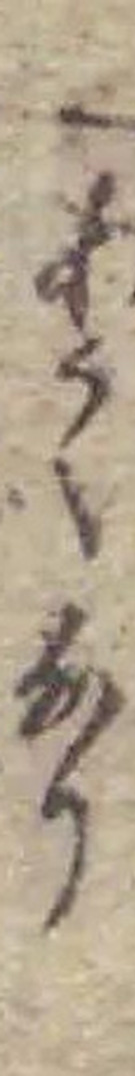あかくなり
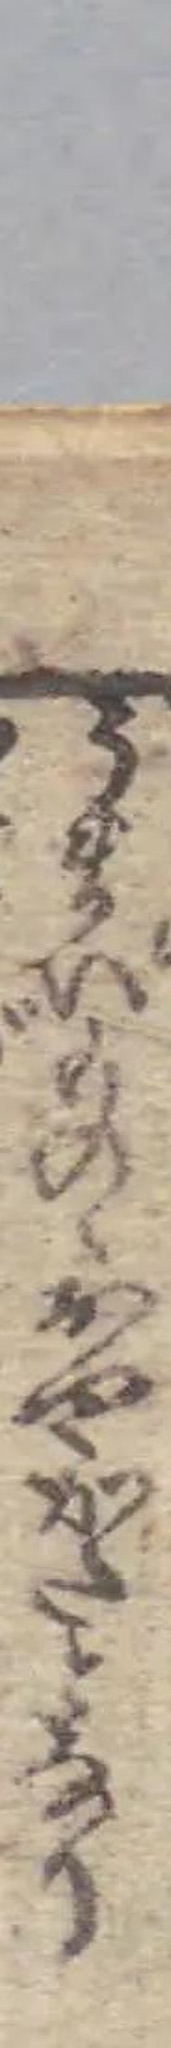うまいものゝおやかたとなり
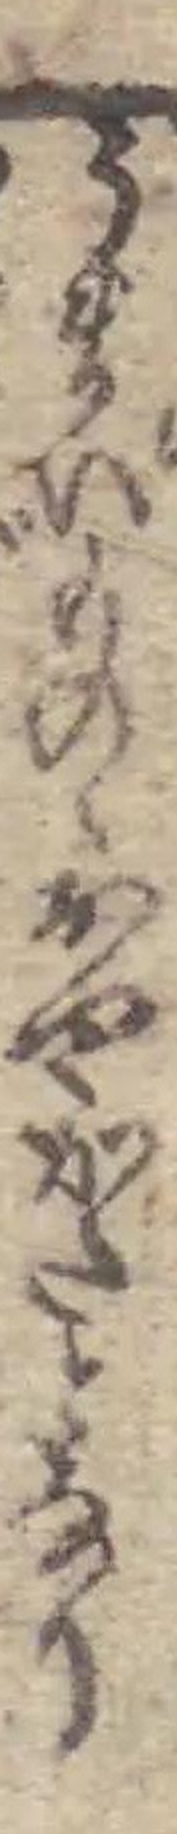うまいものゝおやかたとなり
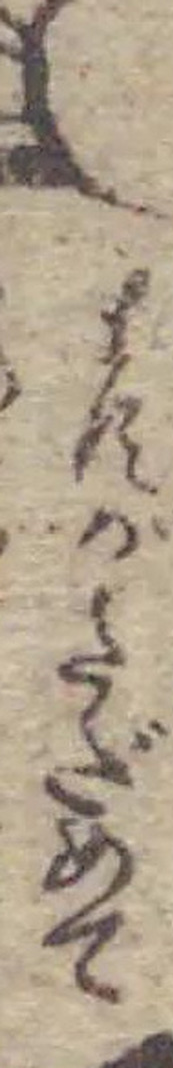ますがさだめて
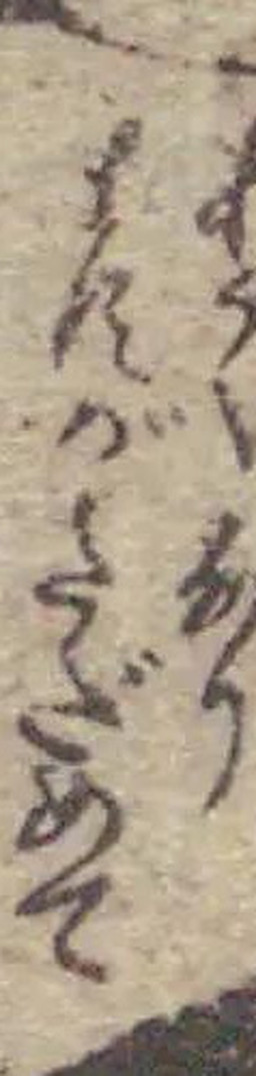ますがさだめて
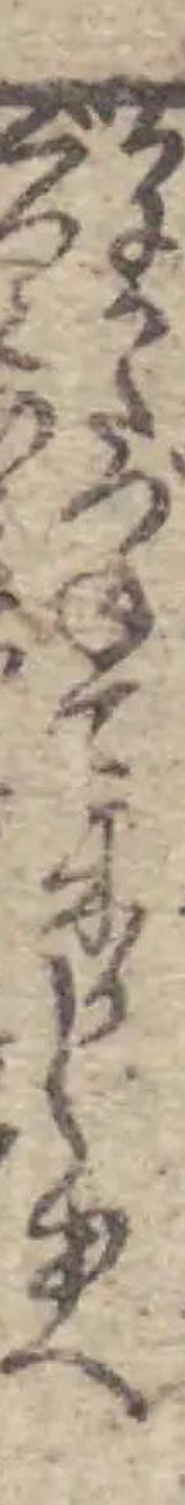かにかたづねて来りしゆへ
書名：蟹牛房挟多 3巻
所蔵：国立国会図書館 National Diet Library, JAPAN
